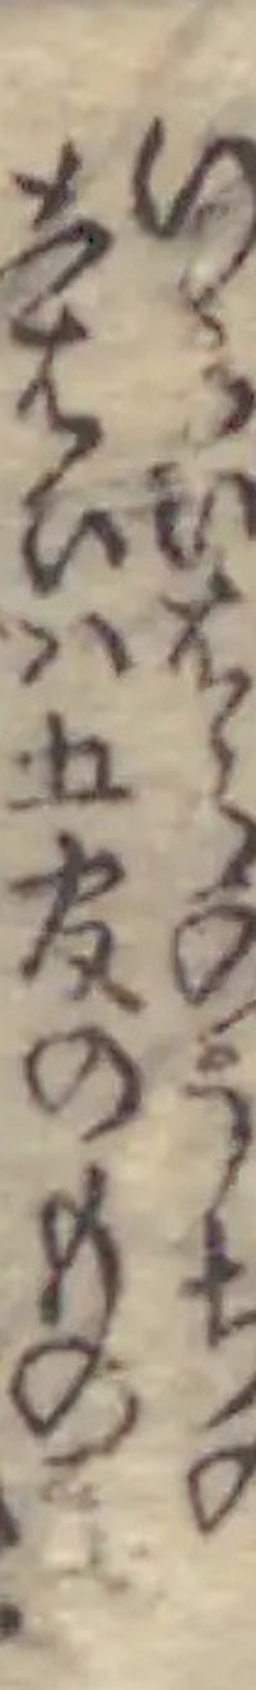しはいは五友のもの
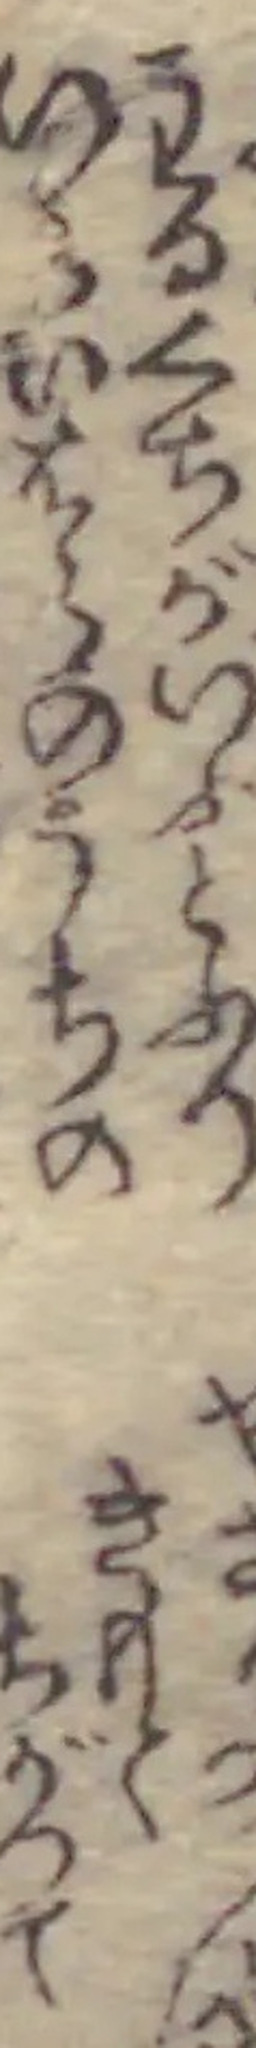いらいはらのうちの
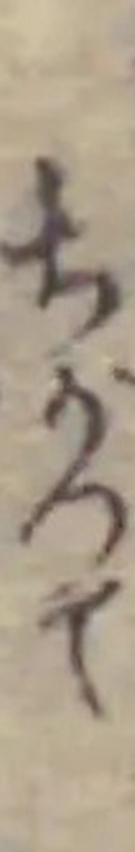ちがつて
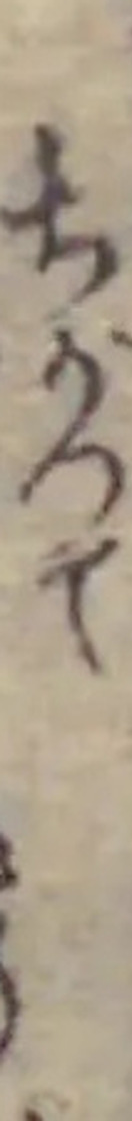ちがつて
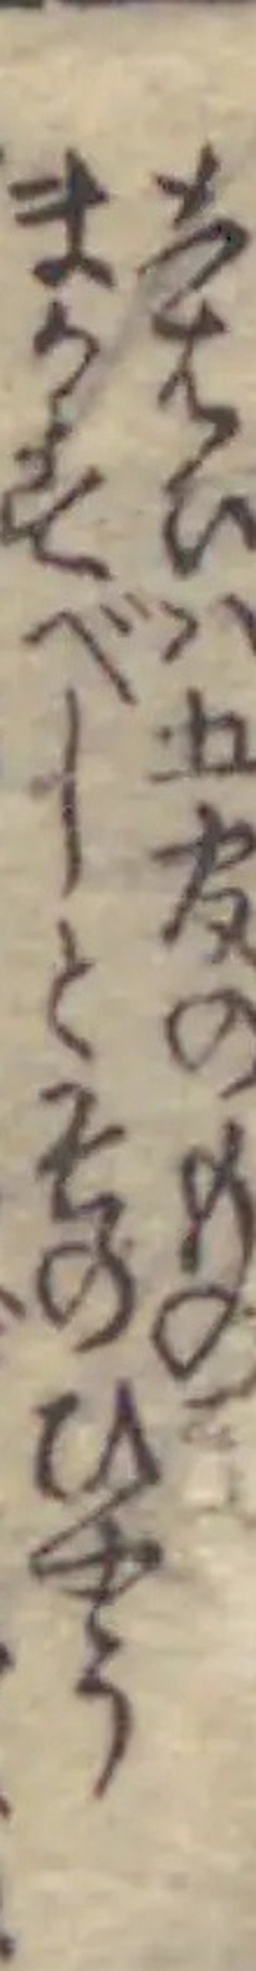まかすべしとそのひやう
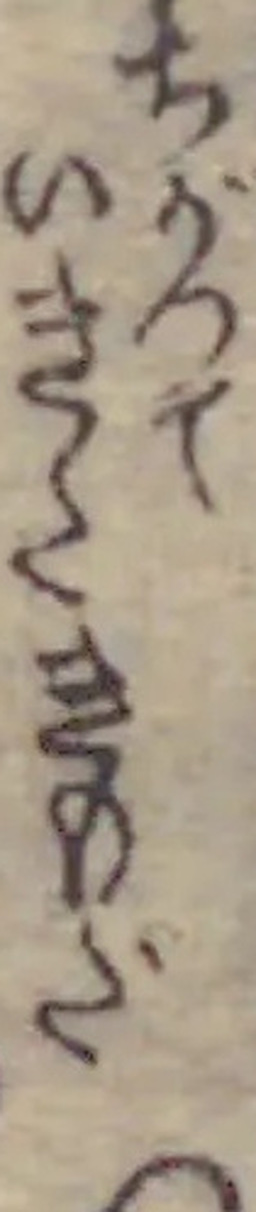いきたきもだ
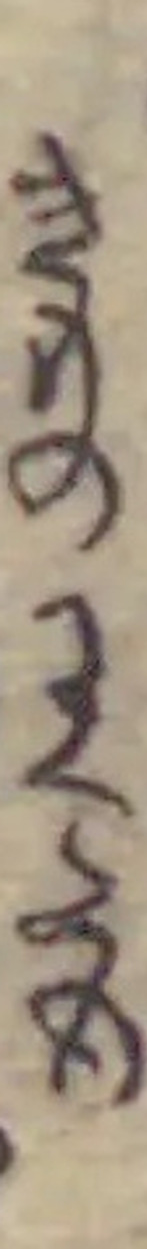きものにへたも
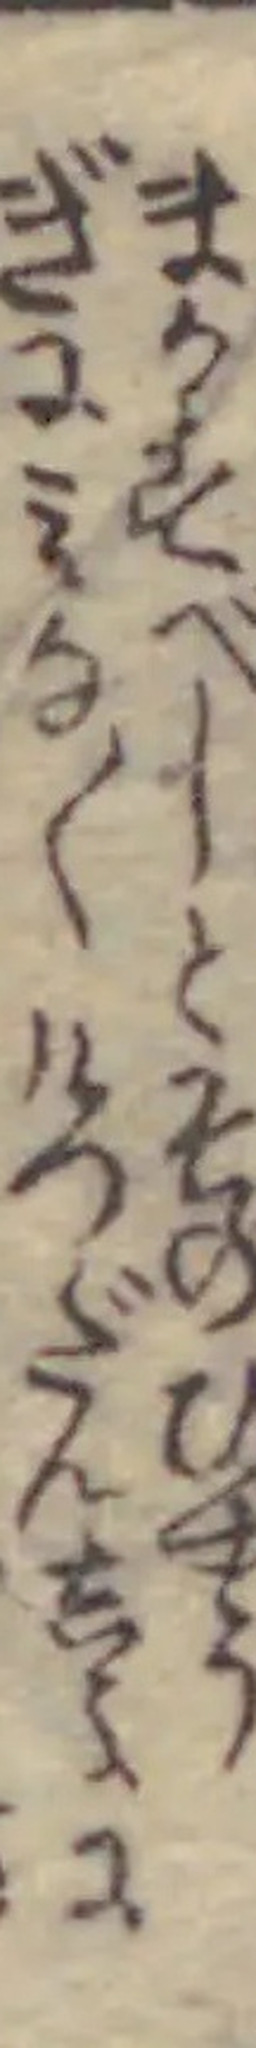ぎにみな〳〵けつだんしるに
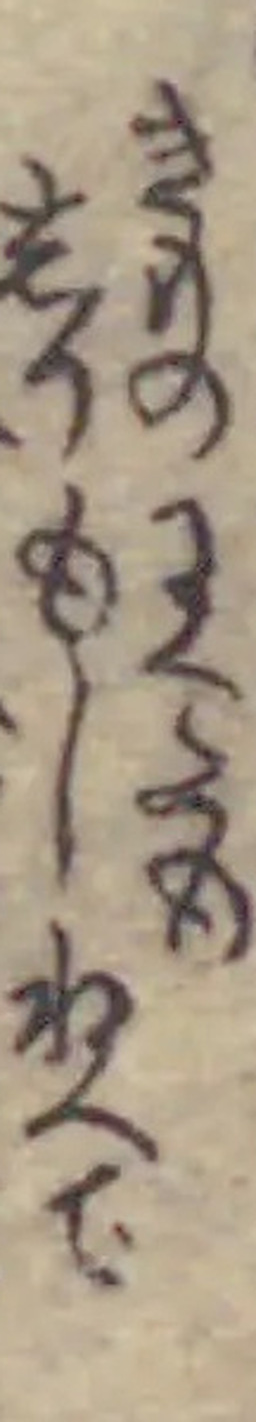しりもしねへで
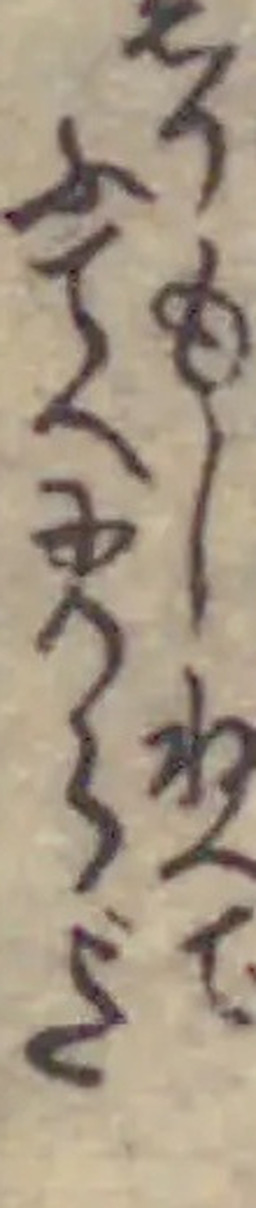ふてへやからだ
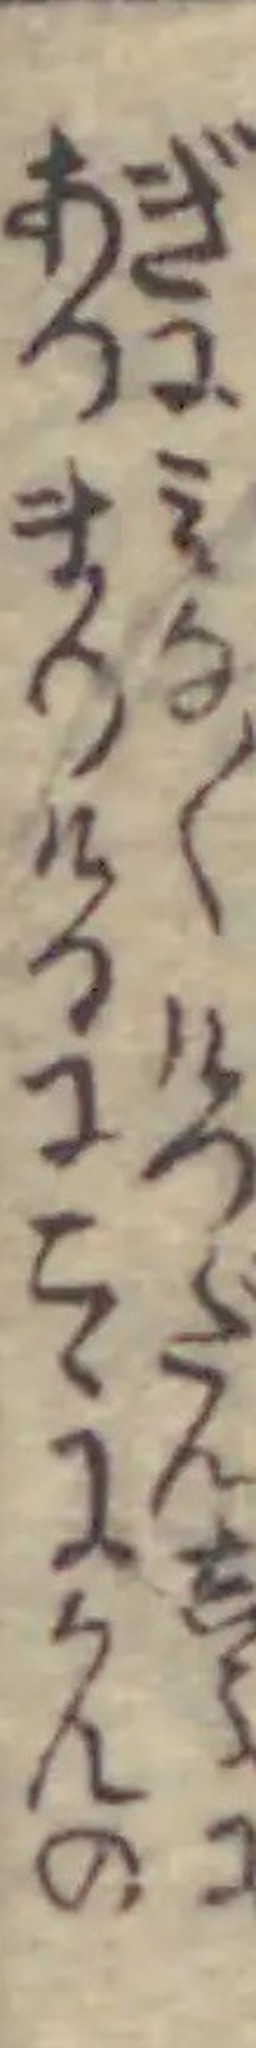あつまりけるにこゝにかんの
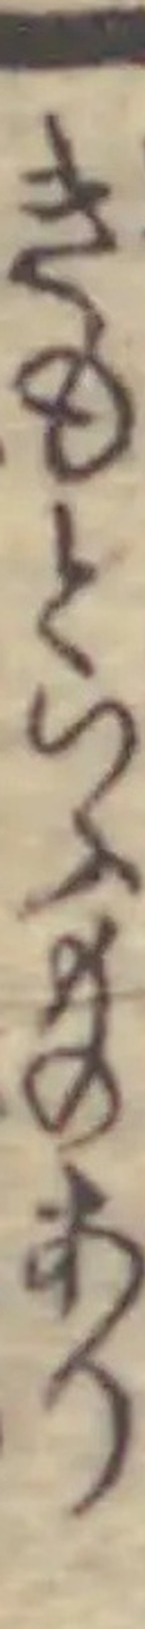きもといふものあり
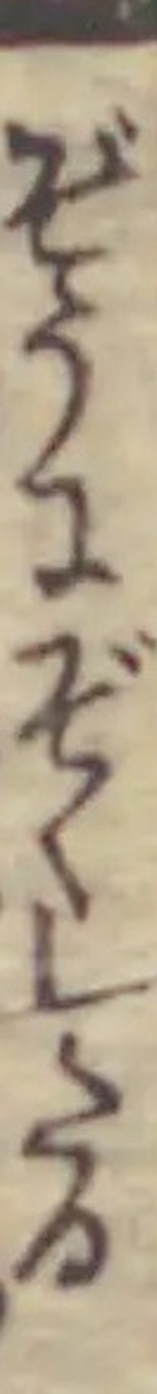ぞうにぞくしたる
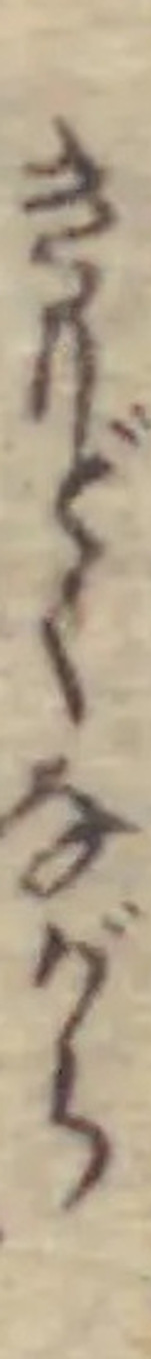きもどくながら
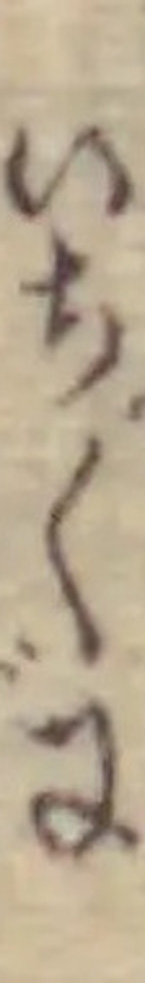いち〳〵に
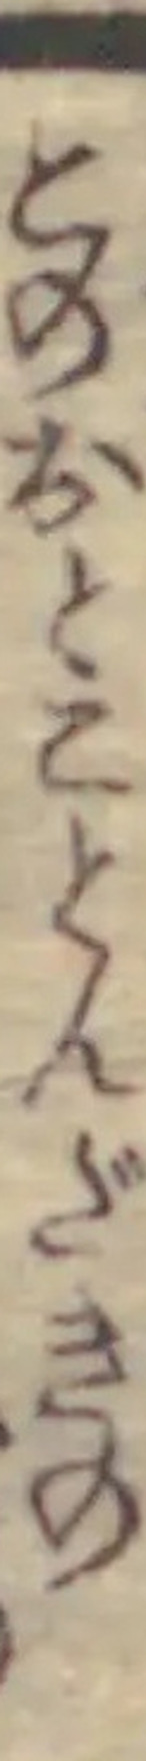このおとことんだきの
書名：腹内養生主論 3巻
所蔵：国立国会図書館 National Diet Library, JAPAN
